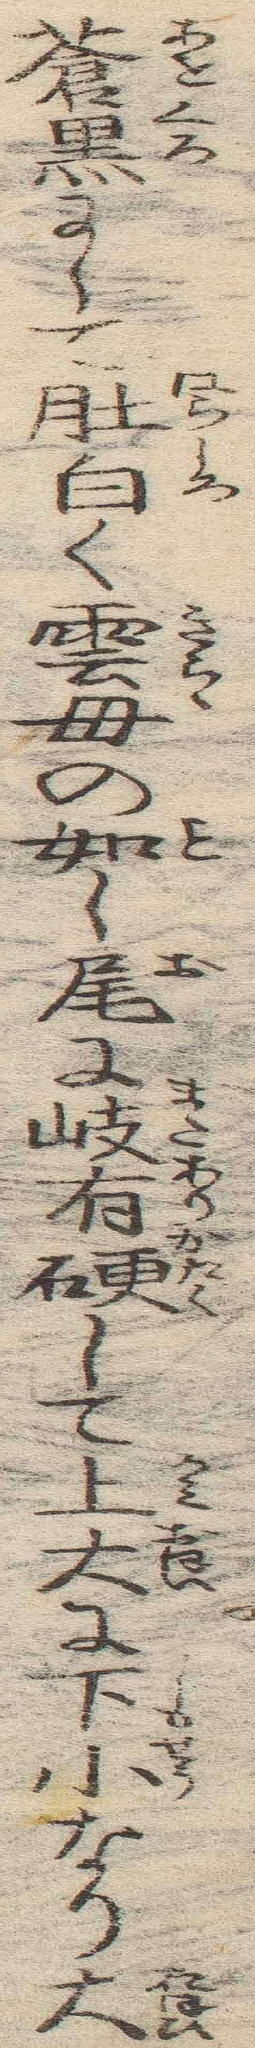蒼黒にして肚白く雲母の如し尾に岐有硬して上大に下小なり大
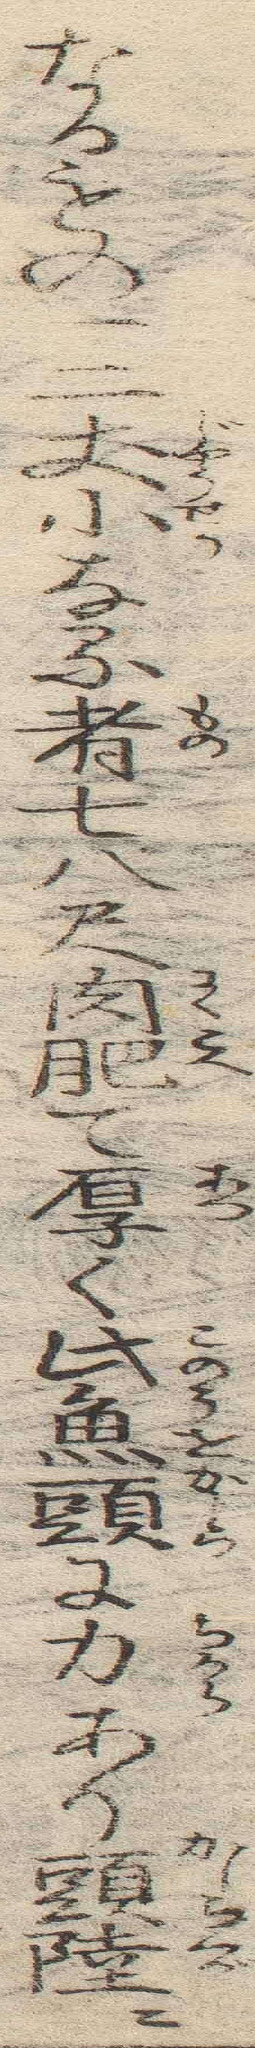なるもの一二丈小なる者七八尺肉肥て厚く此魚頭に力あり頭陸に
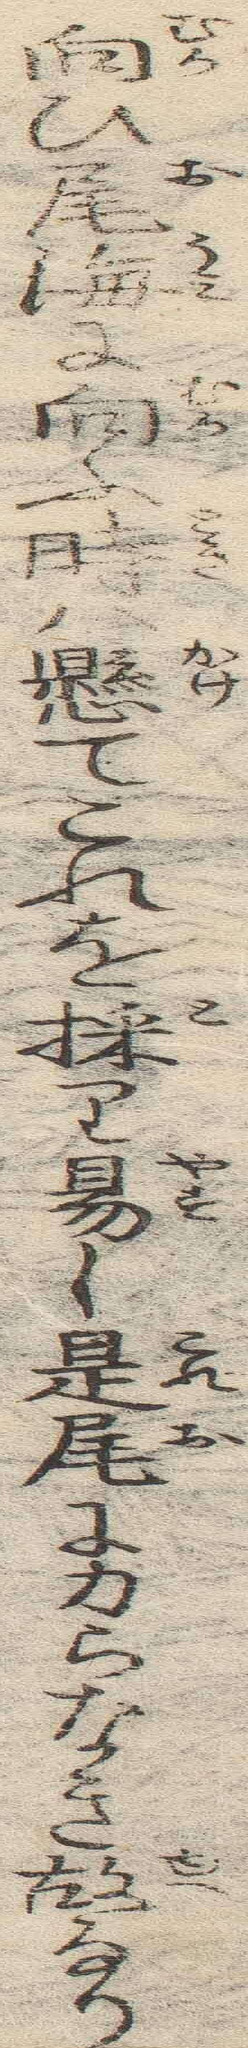向ひ尾海に向ふ時は懸てこれを採り易し是尾に力らなき故なり
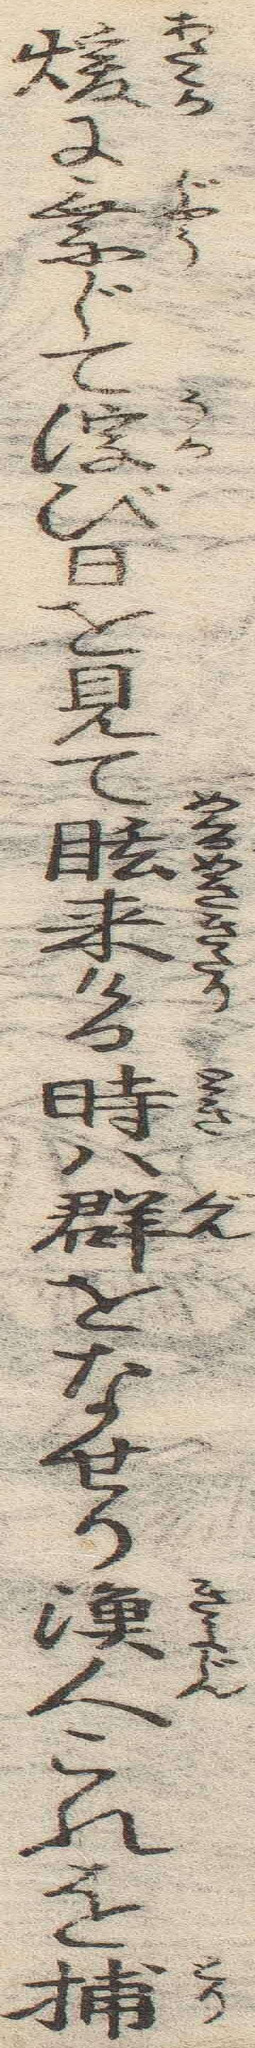煖に乗じて浮び日を見て眩来ける時は群をなせり漁人これを捕
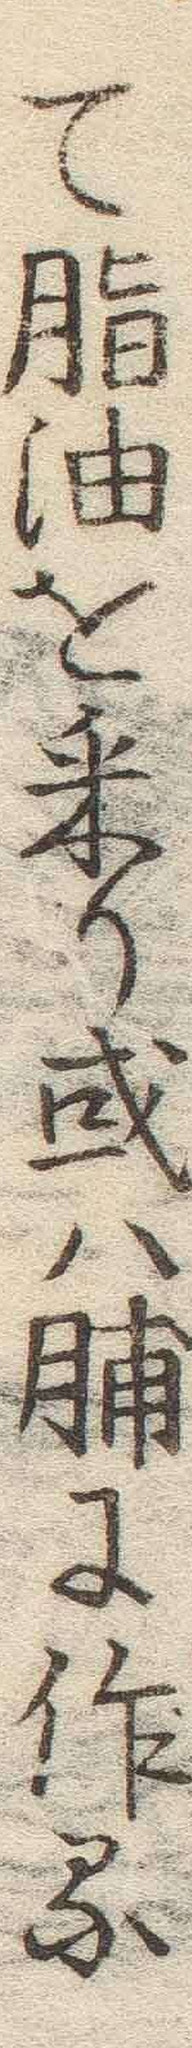て脂油を采り或は脯に作る
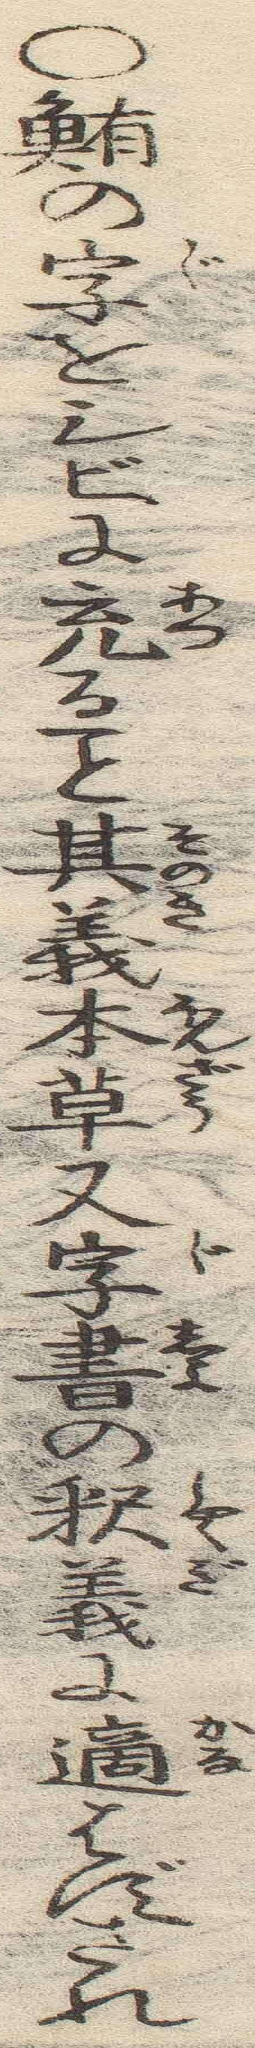○鮪の字をシビに充ること其義本草又字書の釈義に適はずされ
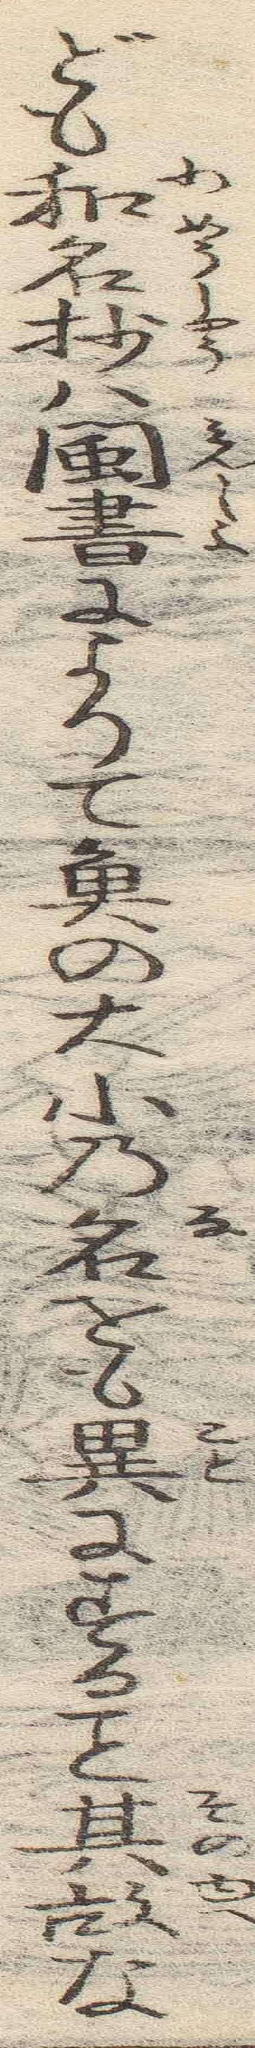ども和名抄は閩書によりて魚の大小の名をも異にすること其故な
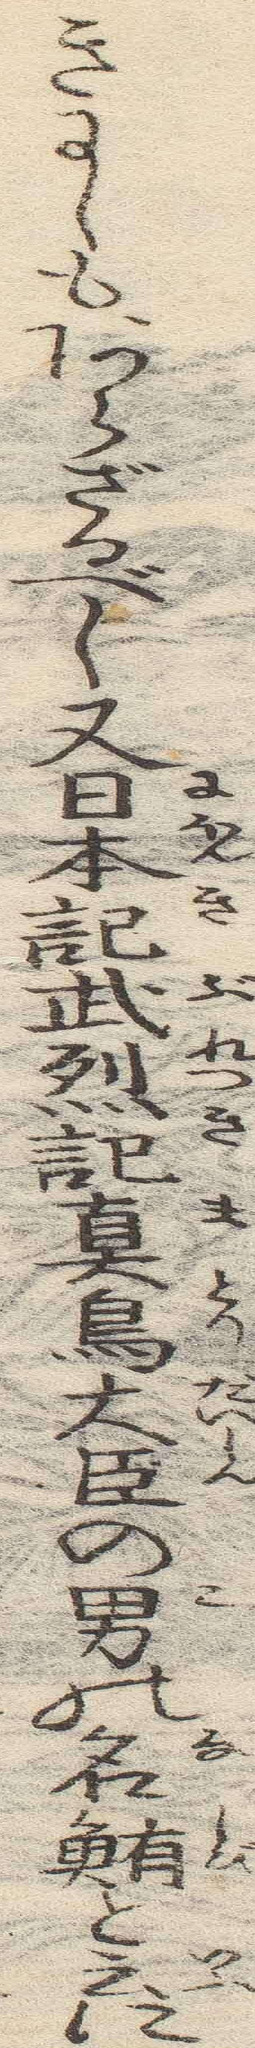きにしもあらざるべし又日本記武烈記真鳥大臣の男の名鮪と云に
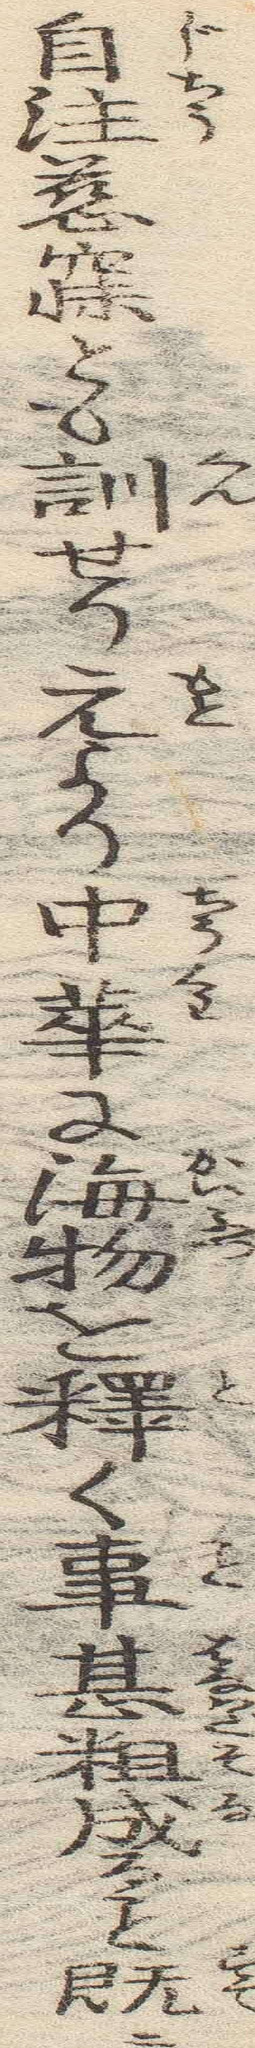自注慈寐とも訓せり元より中華に海物を釈く事甚粗成ること既に
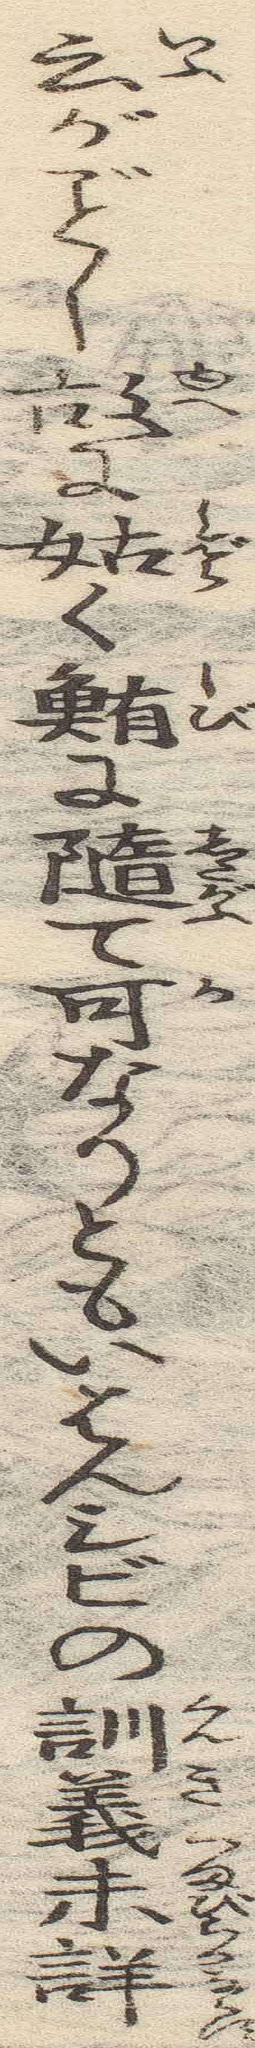云がごとし故に姑く鮪に随て可なりともいはんシビの訓義未詳
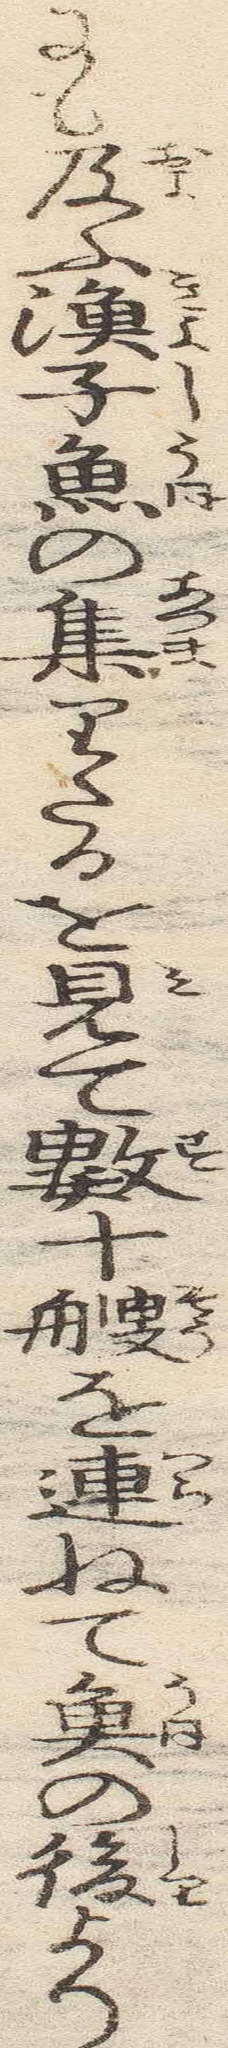にも及ふ漁子魚の集りたるを見て数十艘を連ねて魚の後より
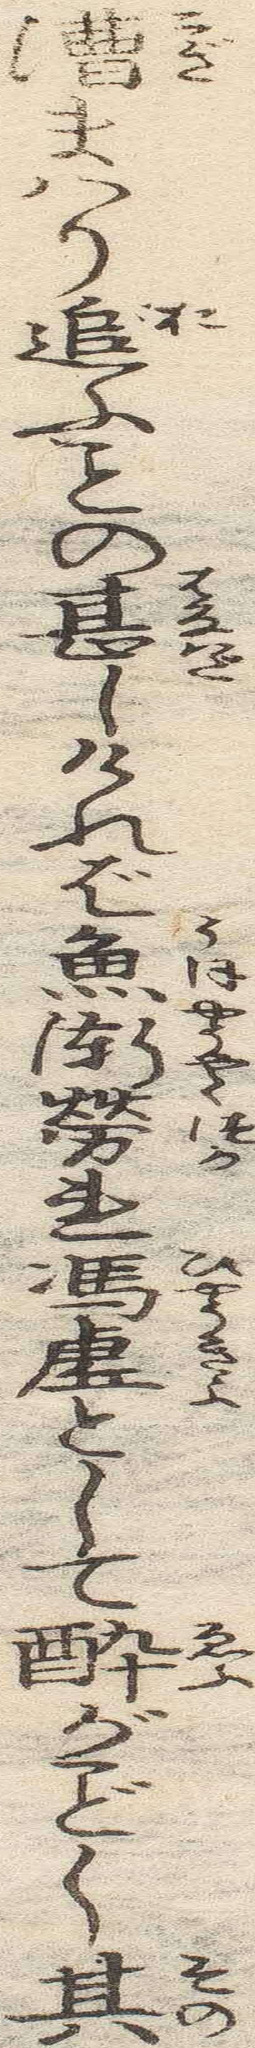漕まはり追ふことの甚しければ魚漸労れ馮虚として酔がごとし其
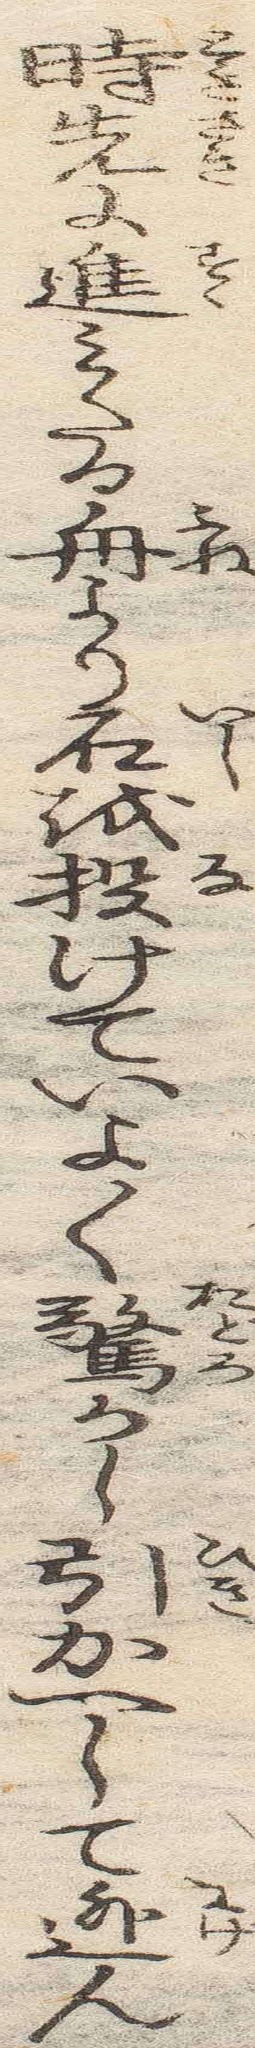時先に進みたる舟より石を投けていよ〳〵驚かし引かへして逃ん
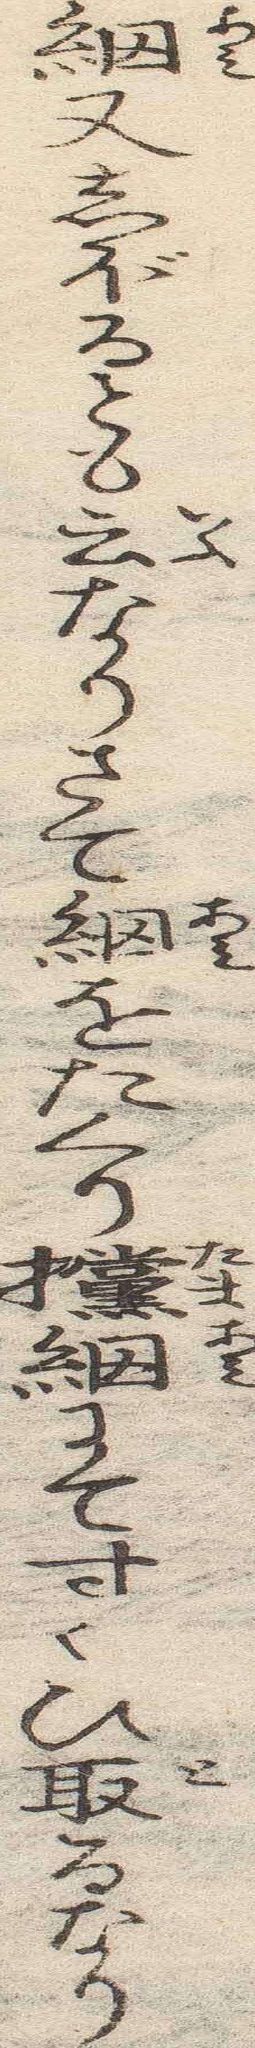網又しぼるとも云なりさて網をたくり攩網にてすくひ取るなり
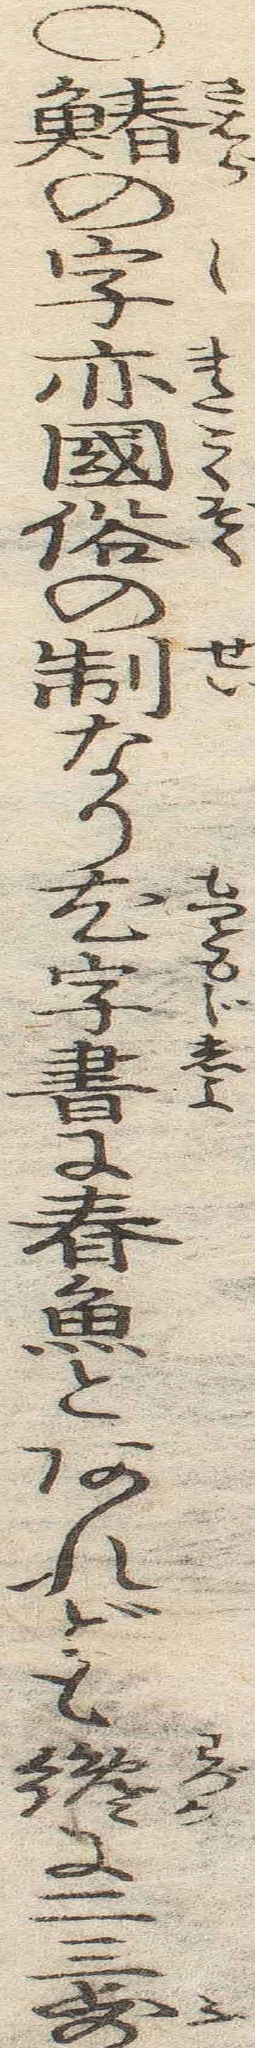○鰆の字亦国俗の制なり尤字書に春魚とあれども纔に二三歩
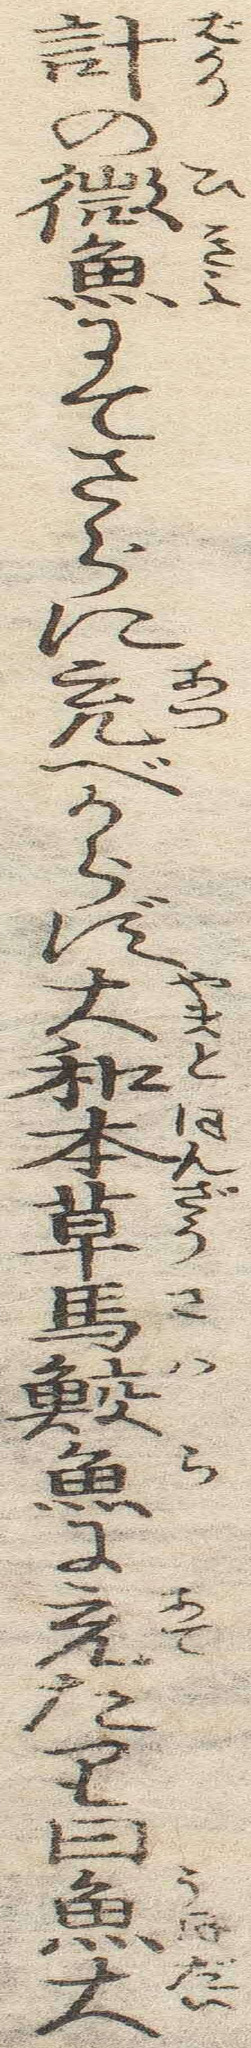計の微魚にてさらに充べからず大和本草馬鮫魚に充たり曰魚大
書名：日本山海名産図会
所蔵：東京学芸大学附属図書館 国文学研究資料館
